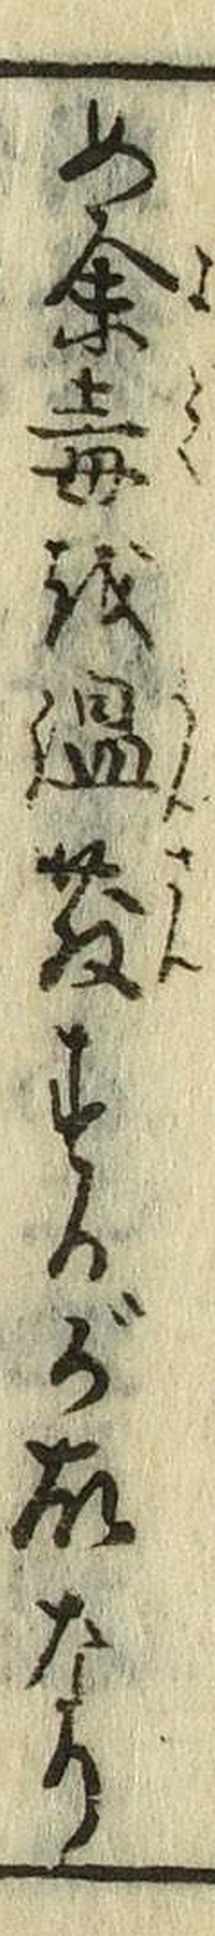め余毒を温散するが故なり
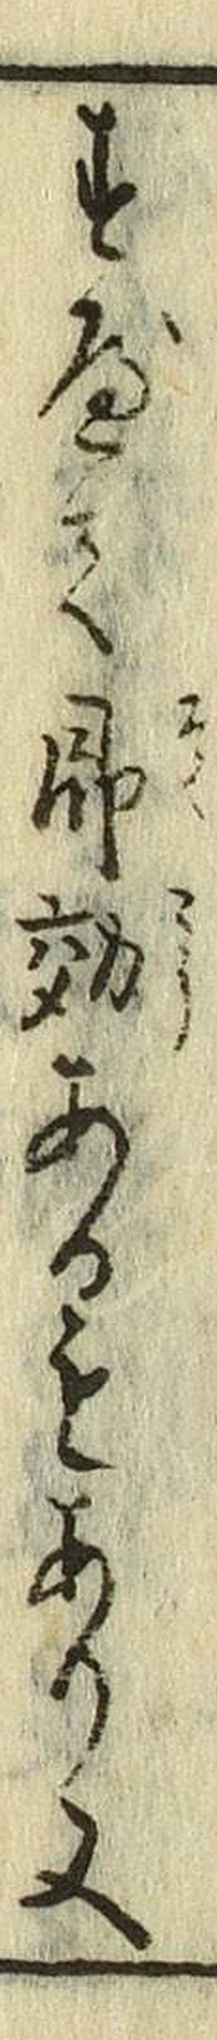すへて即効あるもあり又
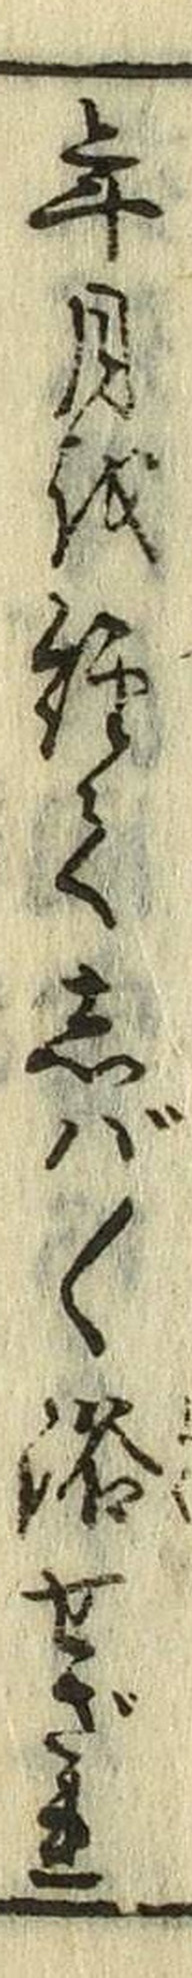年月を経てしば〳〵浴せざれ
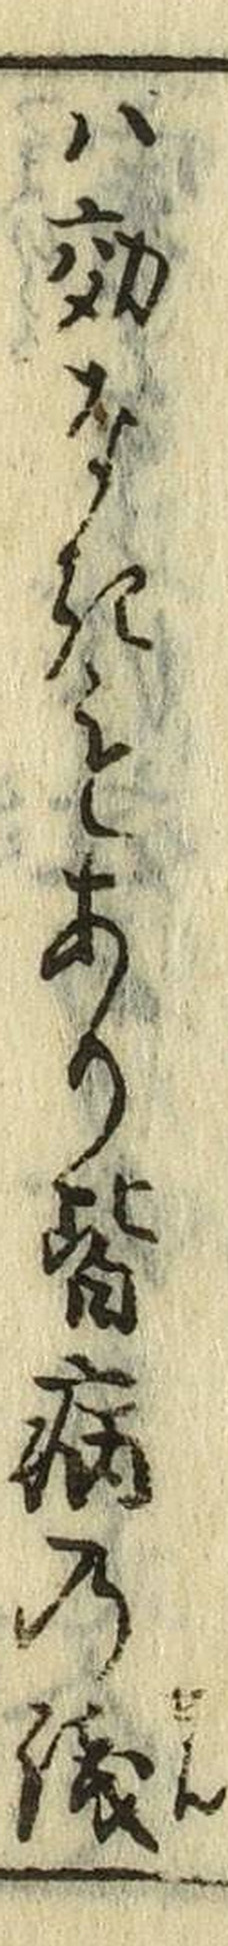は効なきもあり皆病の浅
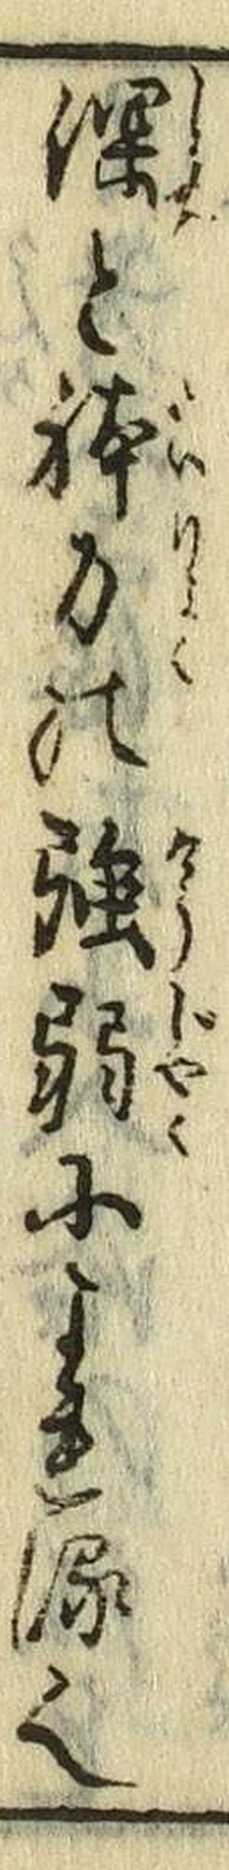深と体力の強弱によれる也
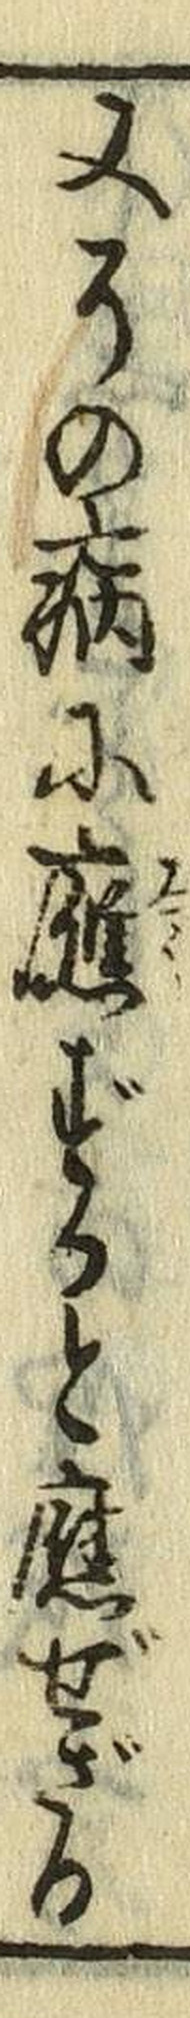又その病に応ずると応ぜざる
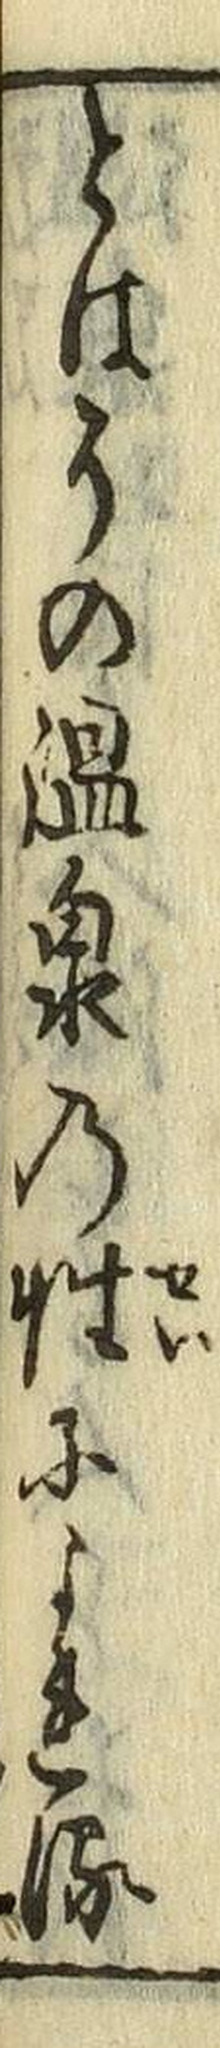とはその温泉の性によれる
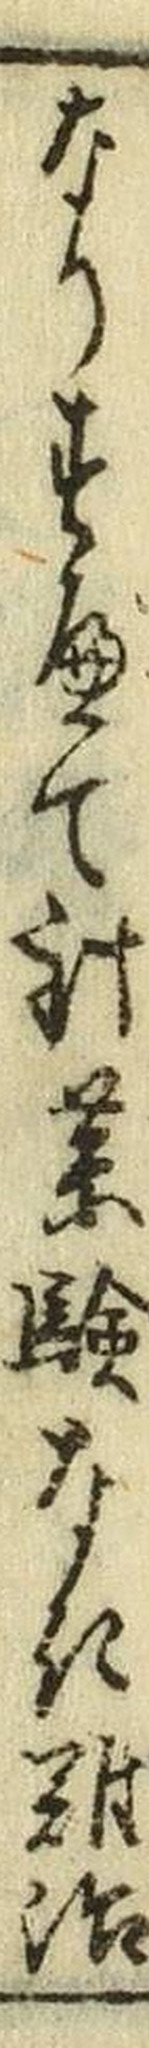なりすべて針薬験なき難治
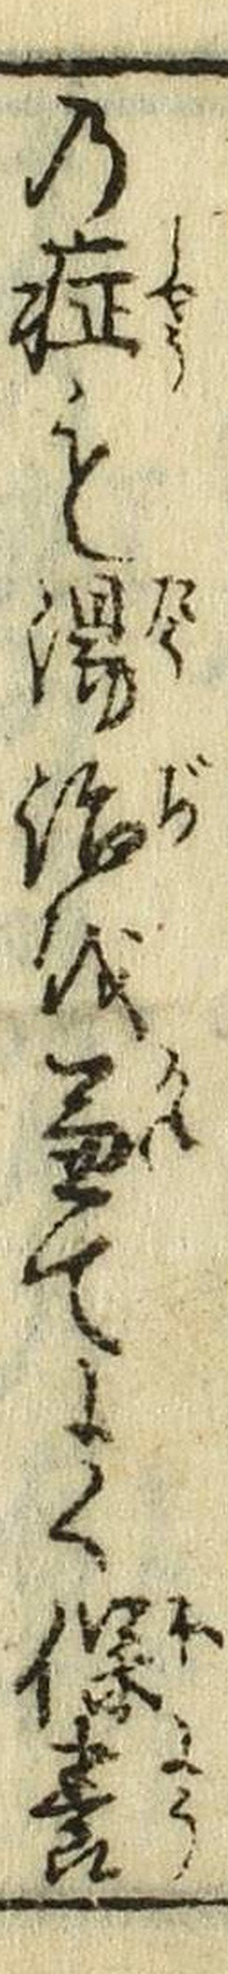の症も湯治を兼てよく保養
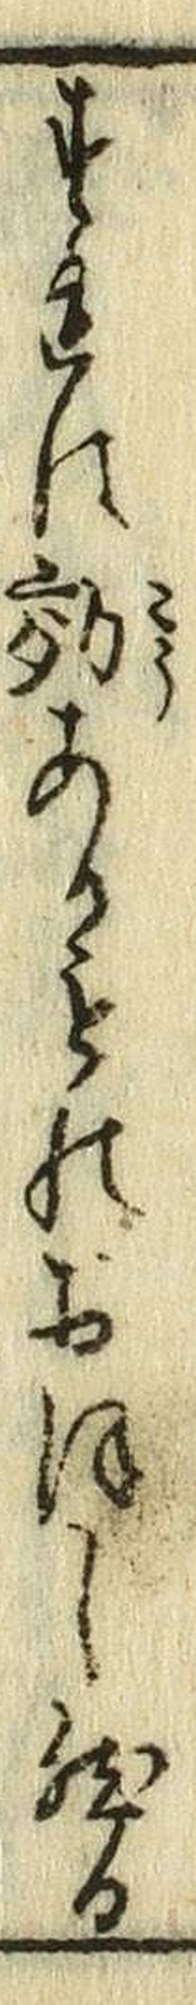すれは効あるものおほし然る
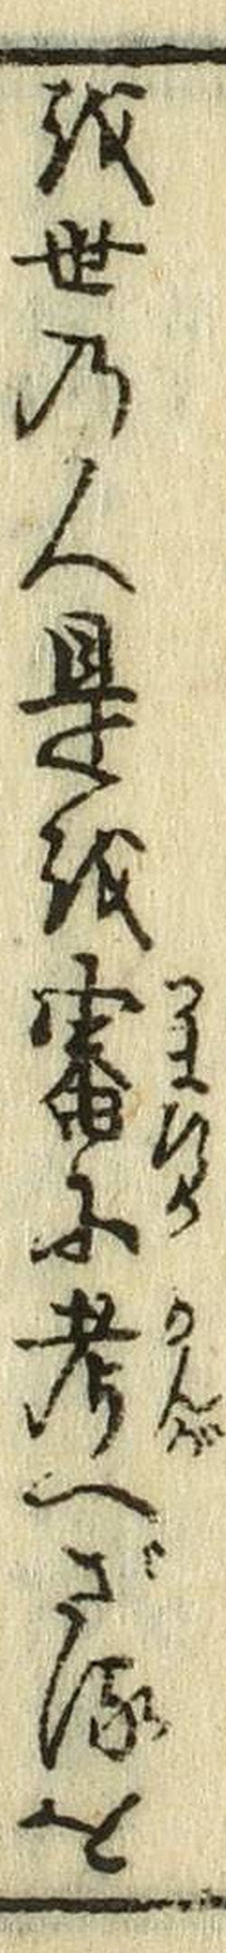を世の人是を審に考へざるを
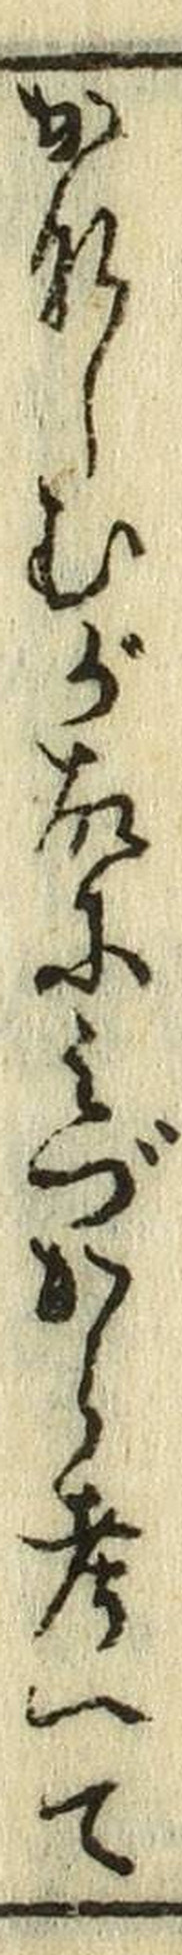かなしむが故にみづから考へて
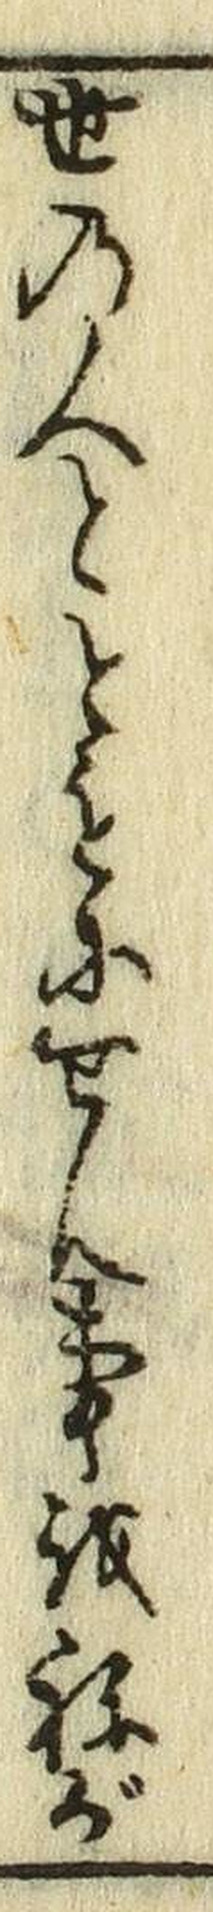世の人とともにせん事をねが
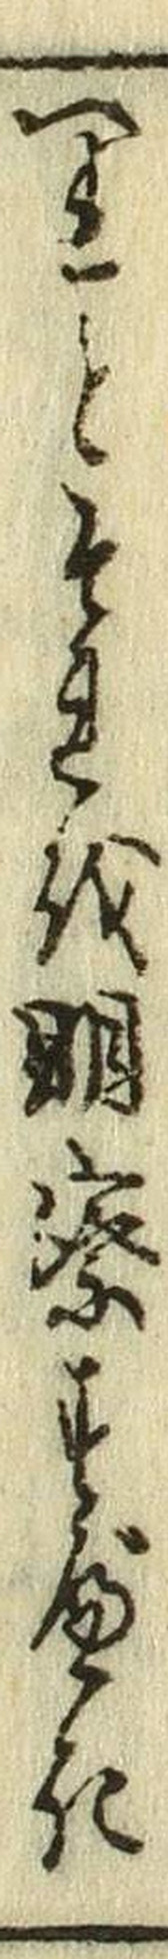へれとそれを明察すべき
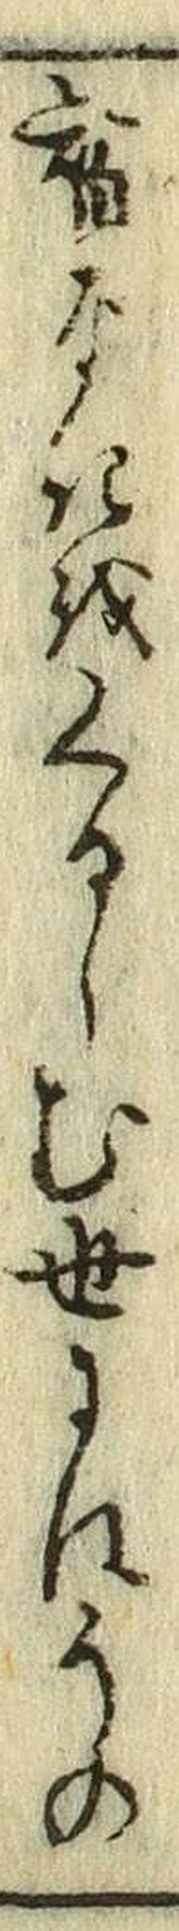智なきをくるしむ世にはその
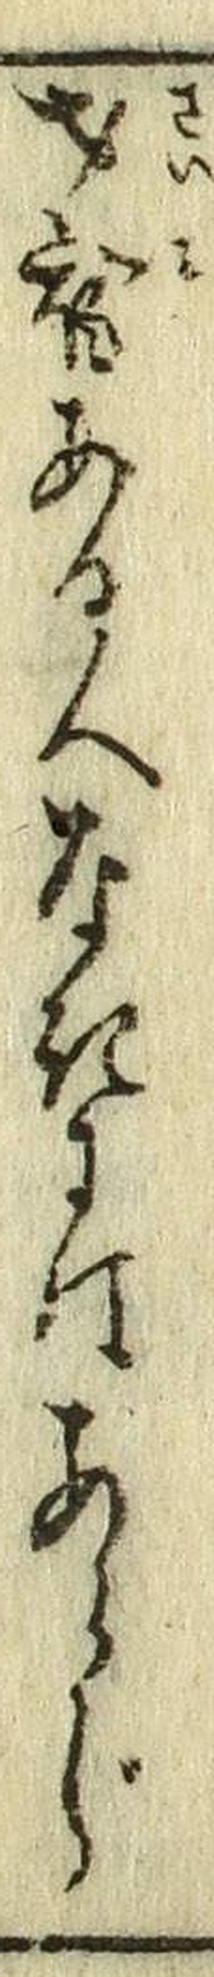才智ある人なきにはあらじ
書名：居家養生記
